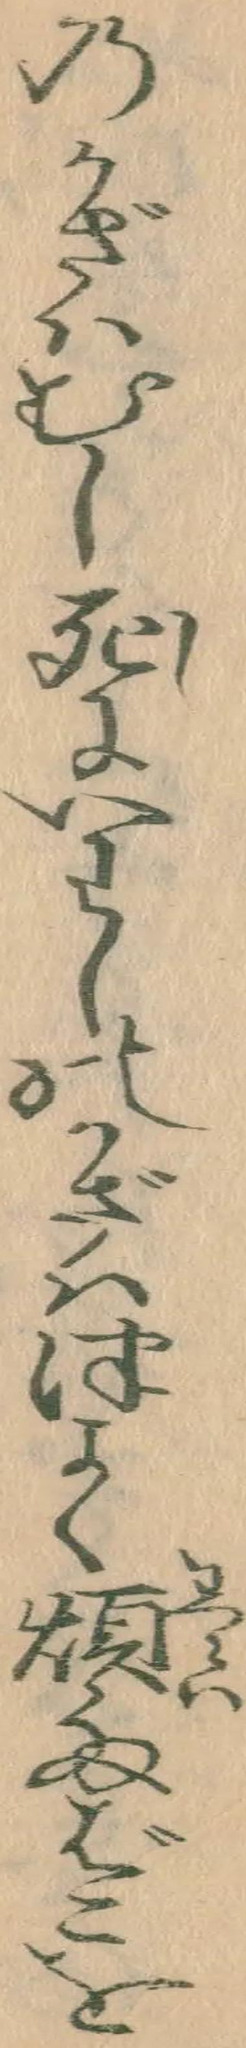のかざはむし死にいわしのかざはつよく煩たばこを
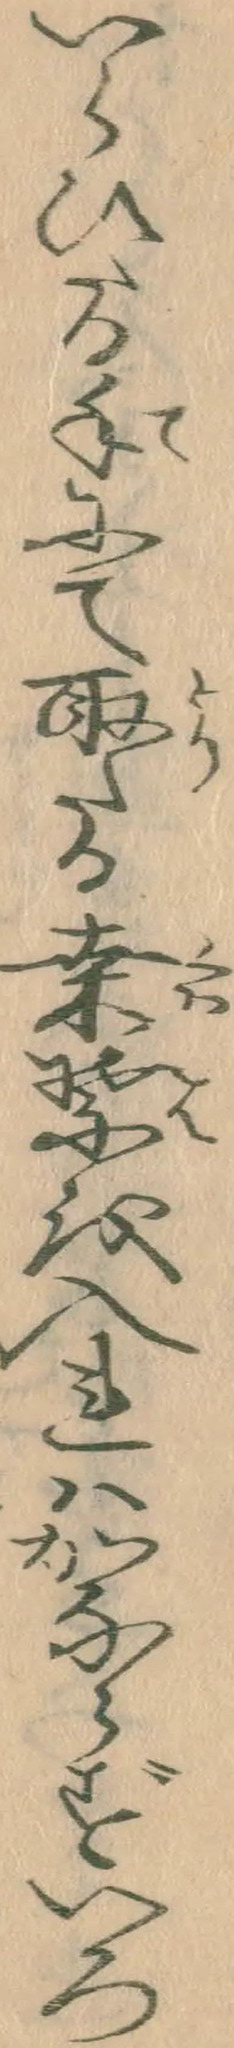いらひたる手にて取たる桑葉を入れはかならずいろ
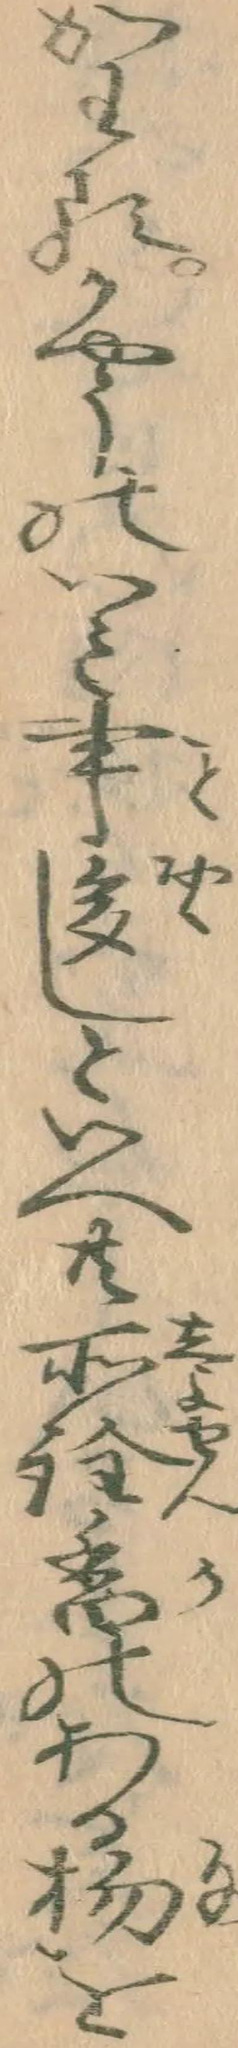かわる。かやうのいみ事多しといへ共所詮香のある物を
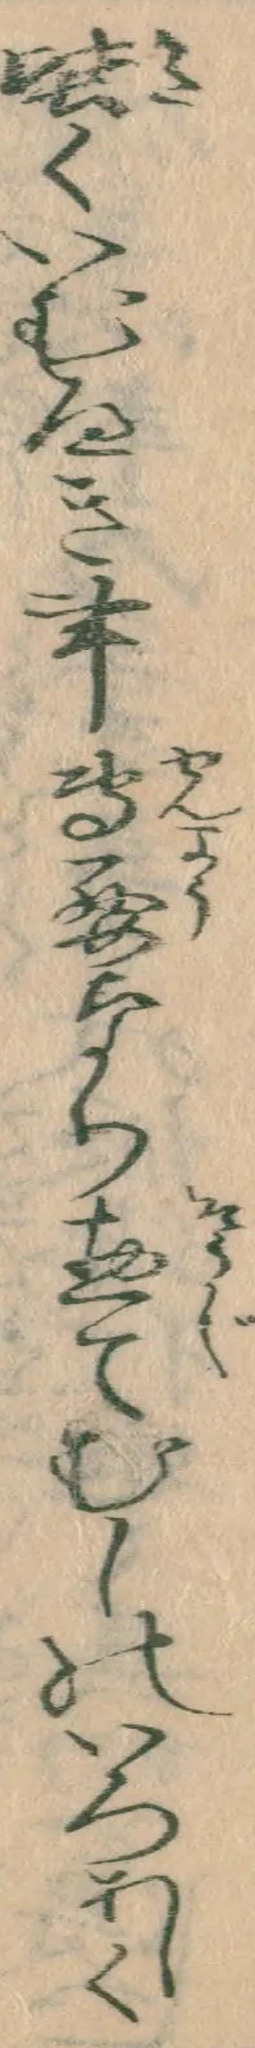堅くいむへき事専要なり惣てむしのいろあしく
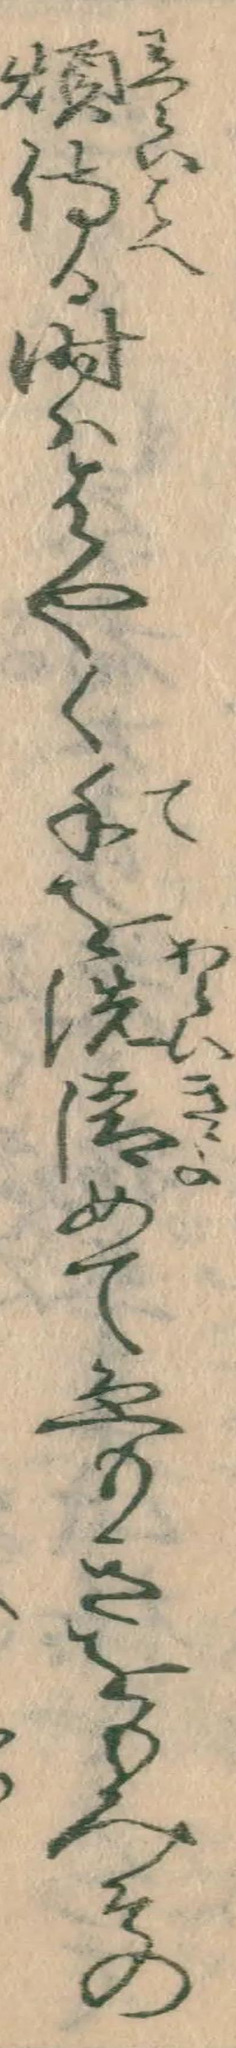煩侍る時ははやく手を洗清めてゑもきをもみその
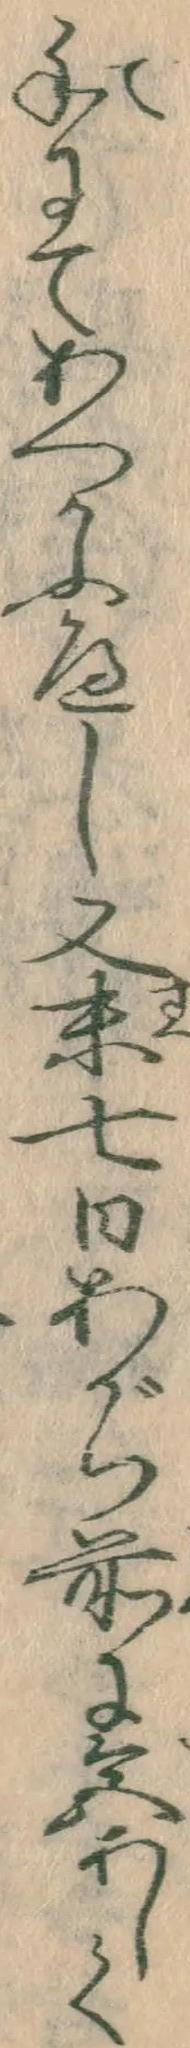手にてあつかふへし又末七日あがり前に色あしく
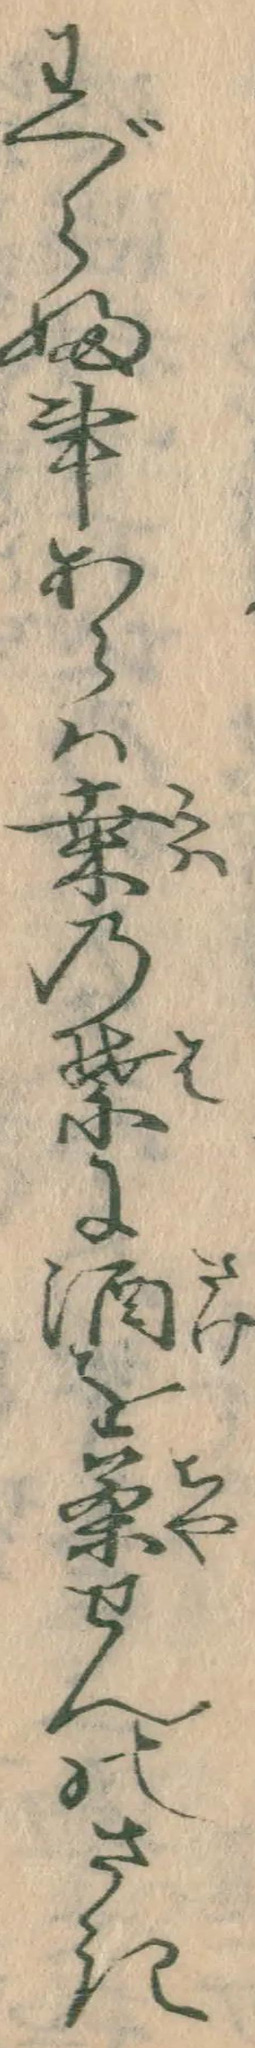わづらふ事あらは桑の葉に酒を茶せんのさき
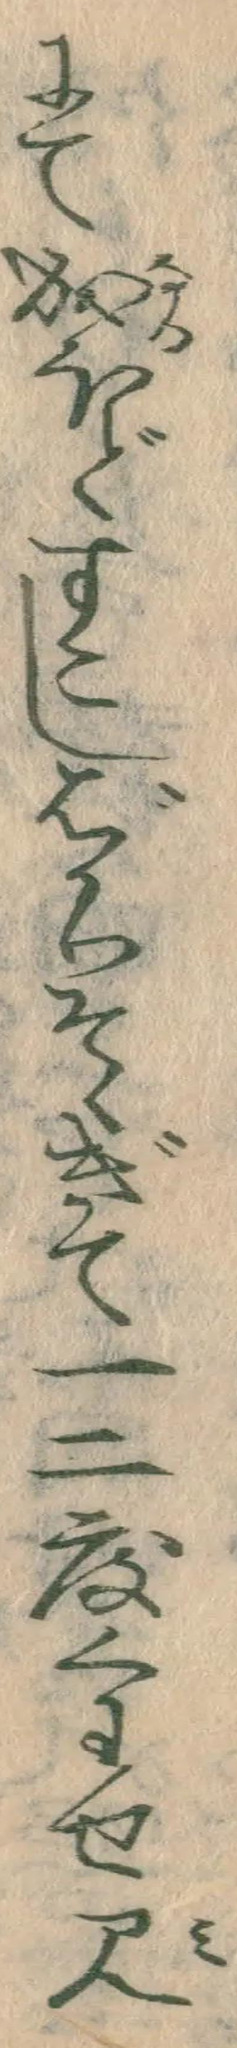にて成ほどすこしばかりそゝぎて一二度くわせ見
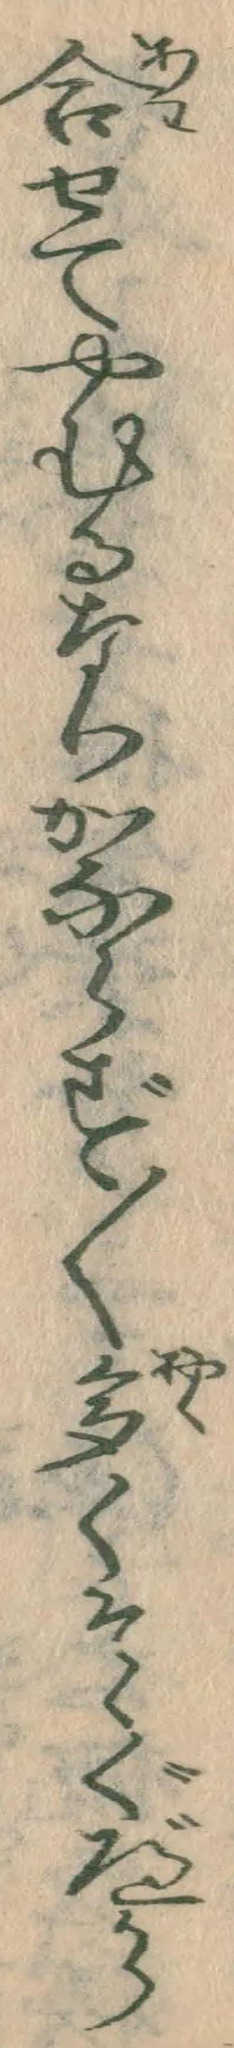合せてやむるなりかならず〳〵多くそゝぐべから
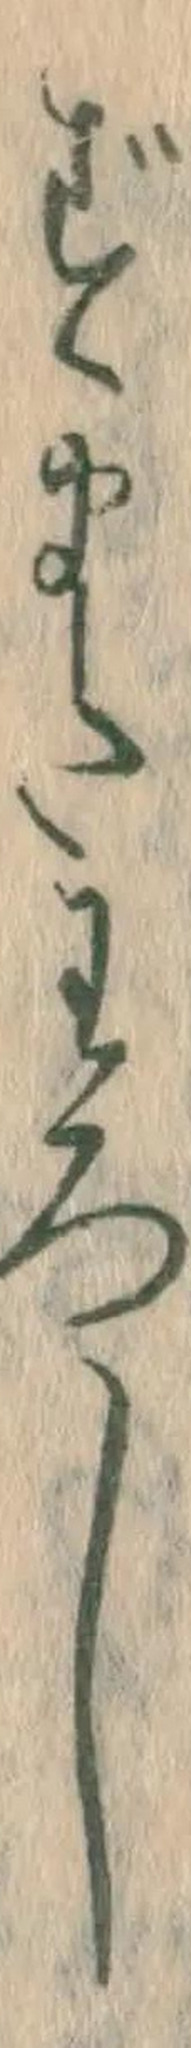ずまたわろし
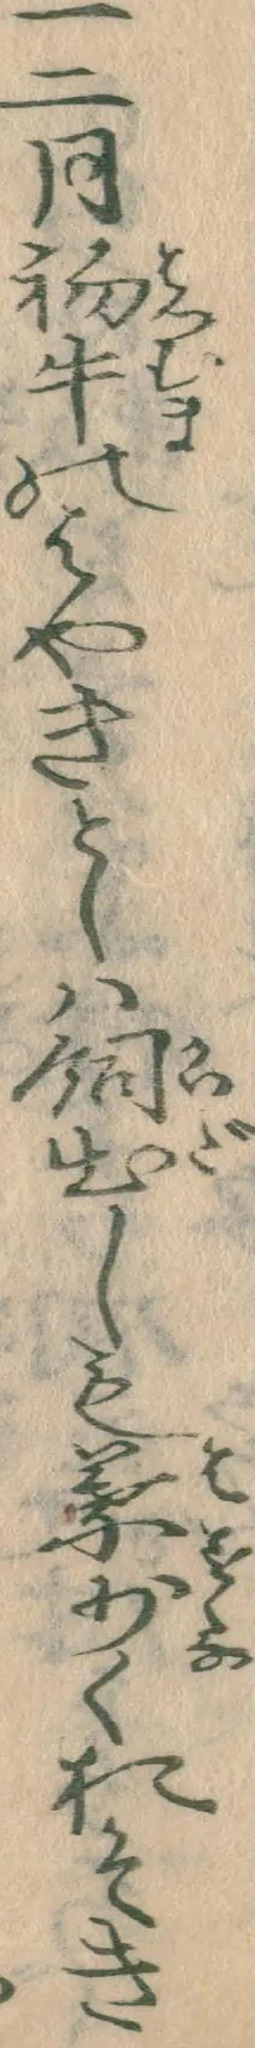一二月初午のはやきとしは飼出しも葉少くおそき
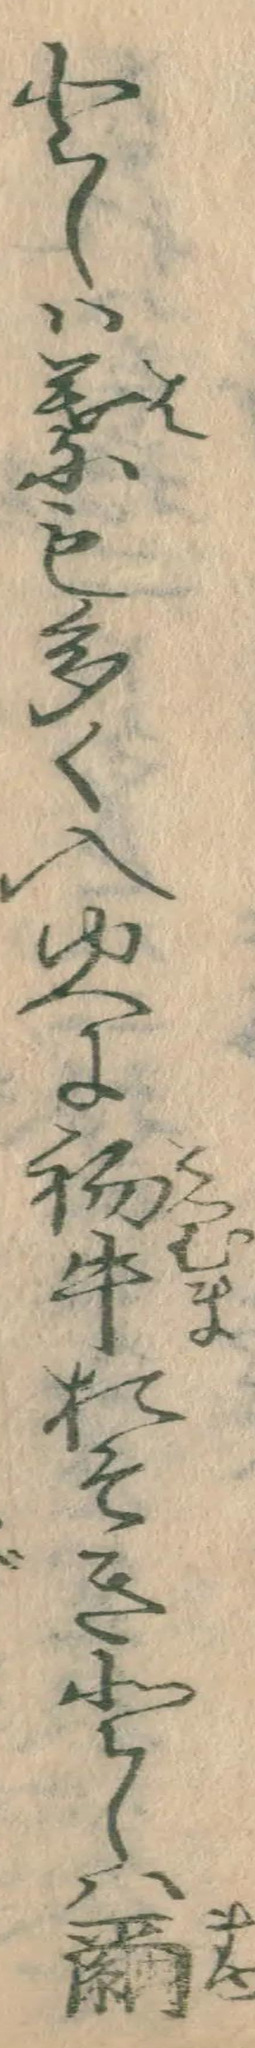としは葉も多く入ゆへに初牛おそきとしは爾
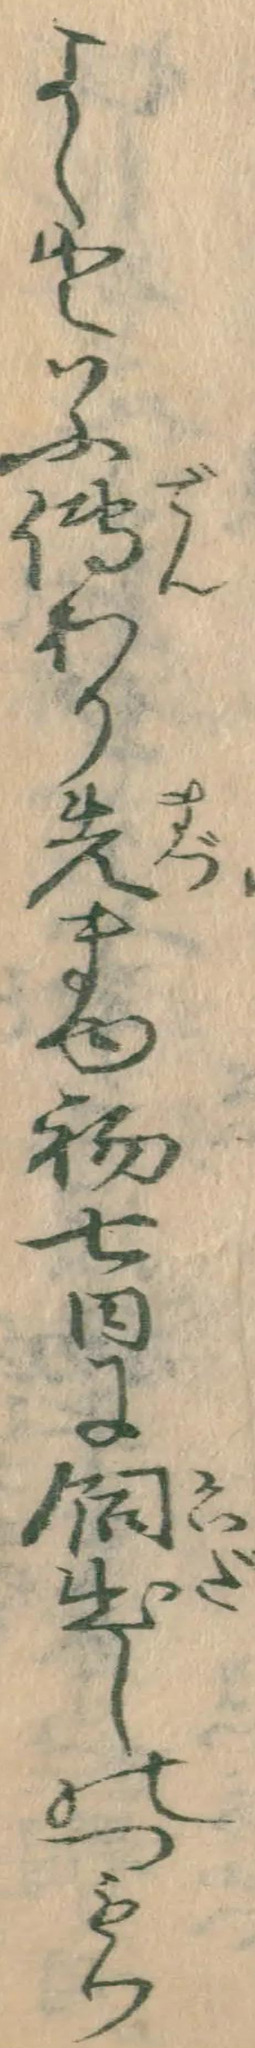よしといふ伝あり先まゆ初七日に飼出しのつもり

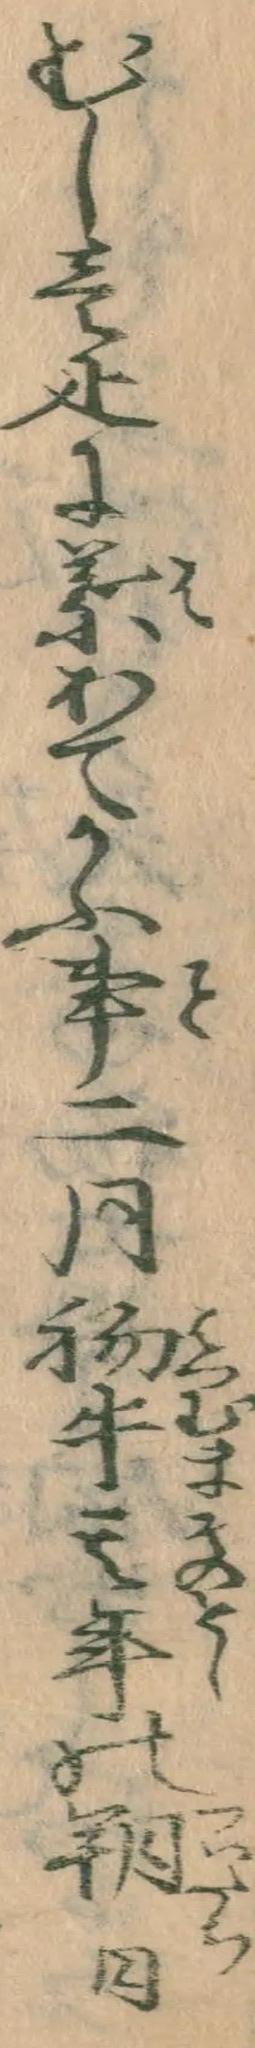むし壱疋に葉あてかふ事二月初午其年の朔日
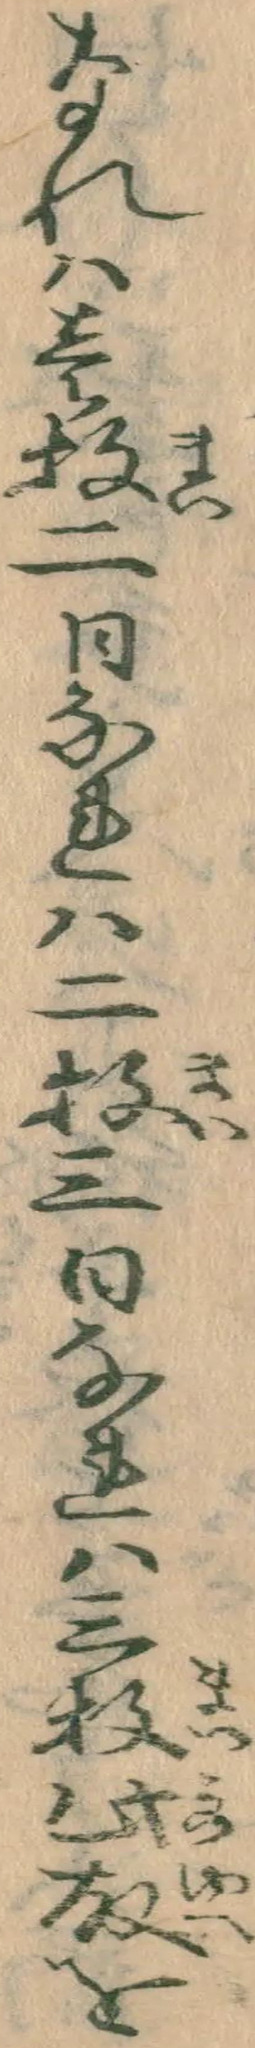なれは壱枚二日なれは二枚三日なれは三枚此故を
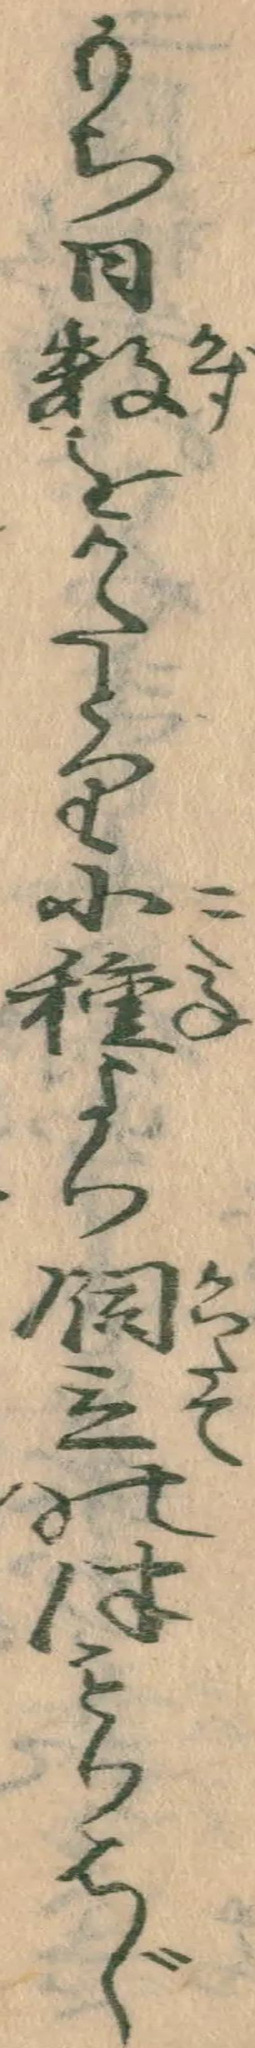もち日数をかたとり小種より飼立のつもりはじ
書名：蚕飼養法記
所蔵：国立国会図書館 National Diet Library, JAPAN
